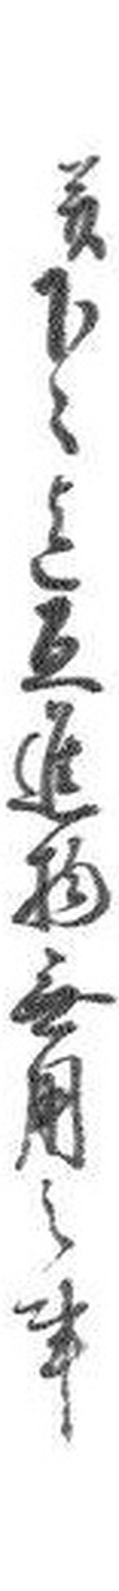并下々迄互進物無用之事
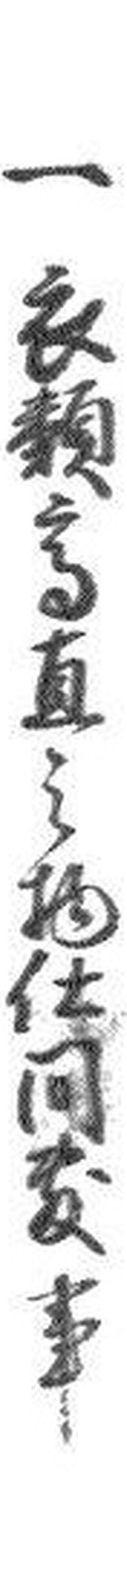一衣類高直之物仕間敷事
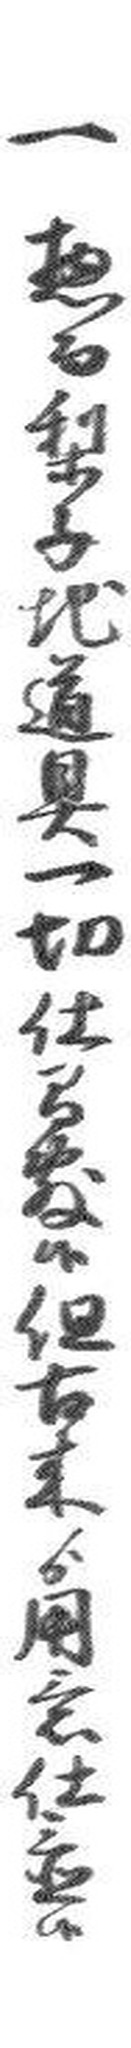一惣而梨子地道具一切仕間敷候但古来ゟ用意仕置候
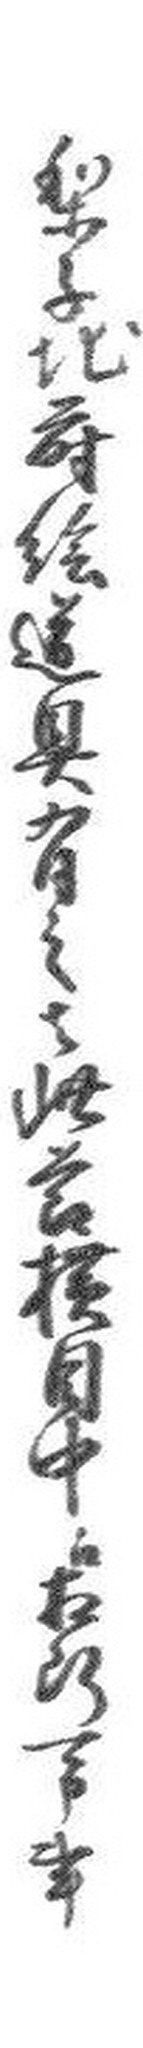梨子地蒔絵道具有之者此節横目中江相断可申事
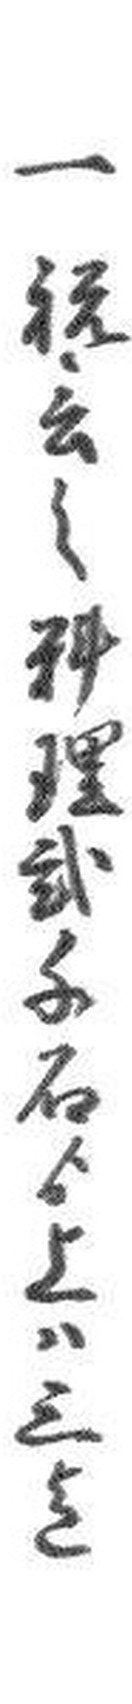一祝言之料理弐千石ゟ上ハ三迄
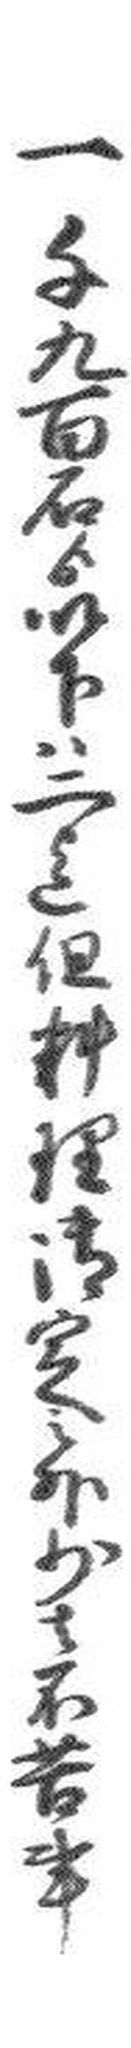一千九百石ゟ以下ハ二迄但料理御定之外少者不苦事
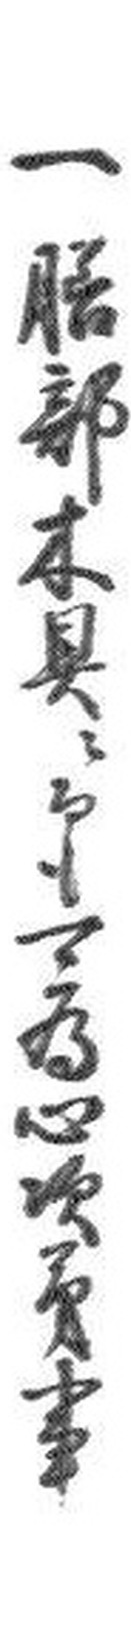一膳部木具ニ而も可為心次第事
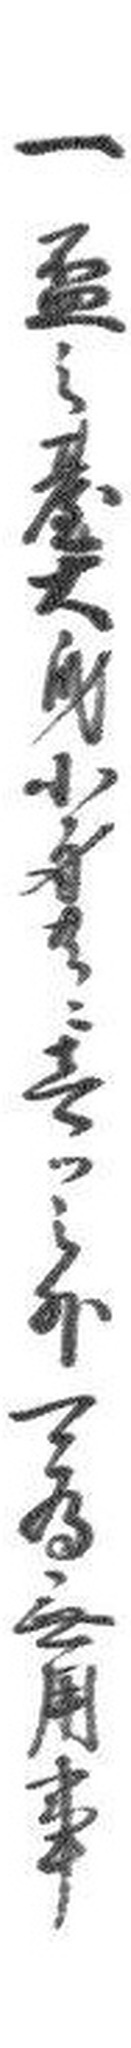一盃之台大身小身共ニ一ツ之外可為無用事
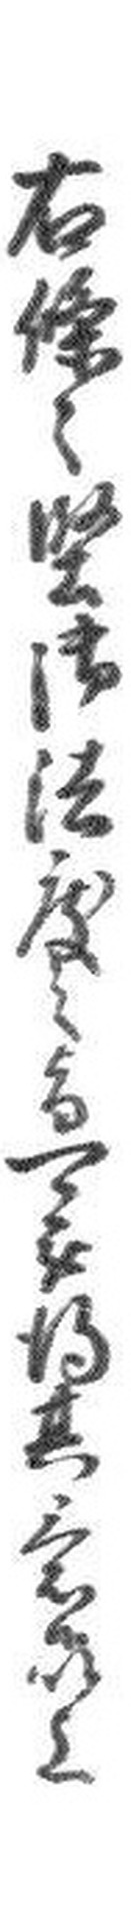右条々堅御法度之旨可被得其意候以上
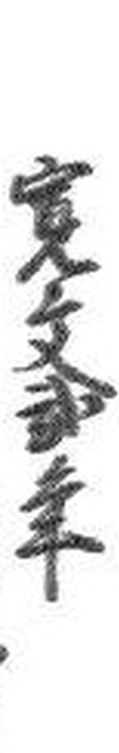寛文弐年
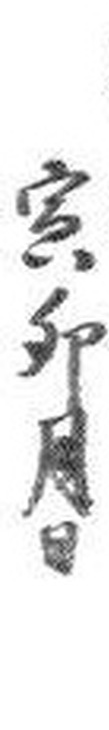寅卯月日

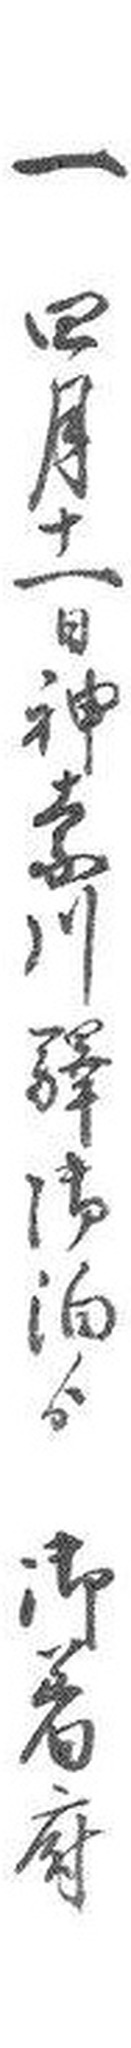一四月十一日神奈川駅御泊ゟ御着府
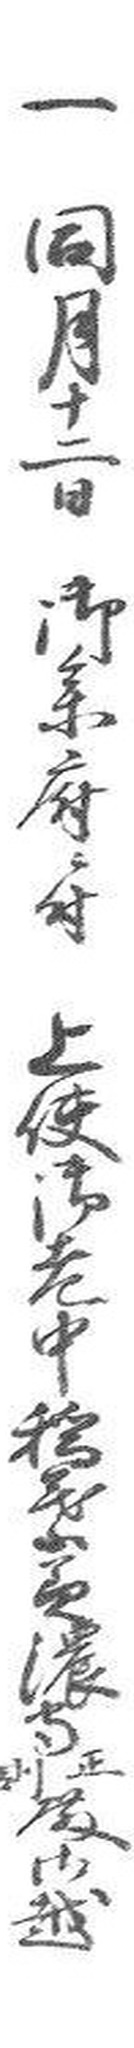一同月十二日御参府ニ付上使御老中稲葉美濃守正則殿御越
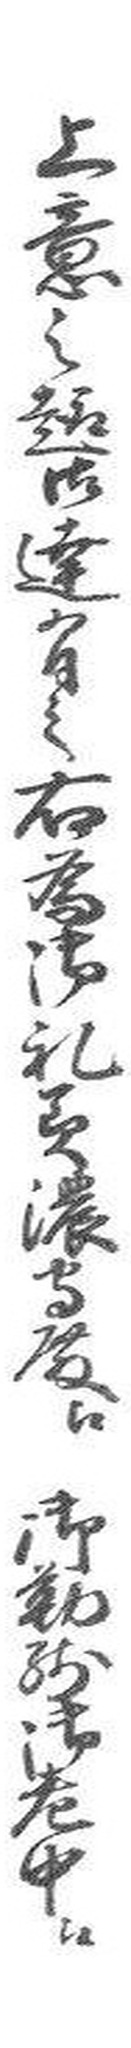上意之趣御達有之右為御礼美濃守殿江御勤残御老中江
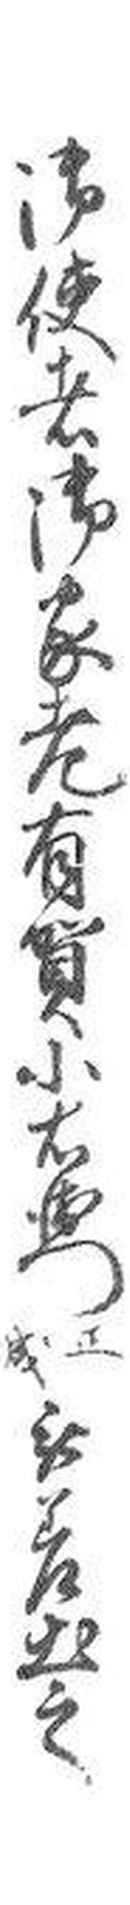御使者御家老有賀小右衛門正成被差出之
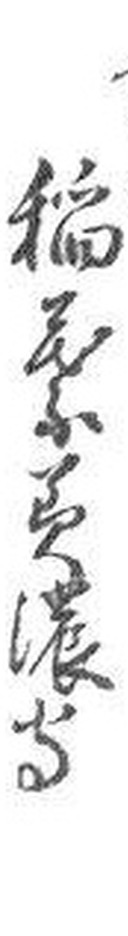稲葉美濃守
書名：家譜 六 光通公 従万治三年到寛文三年
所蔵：福井県文書館 Fukui Prefectural Archives
